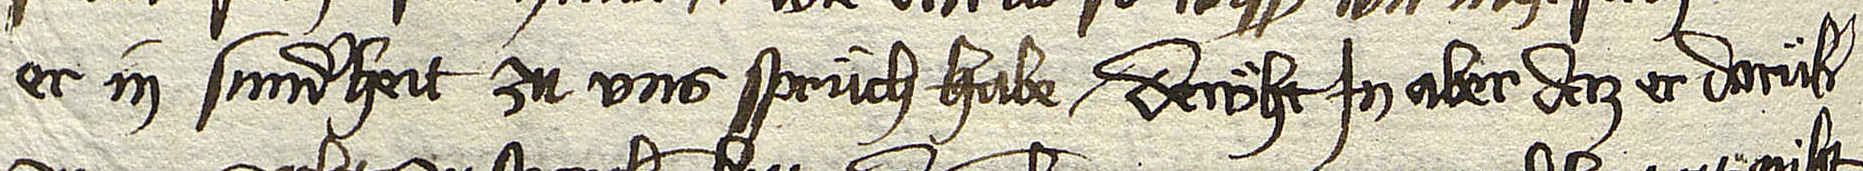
er in ſund*heit ʒu vns ſprüch habe / Dewht In aber daʒ er darüb*
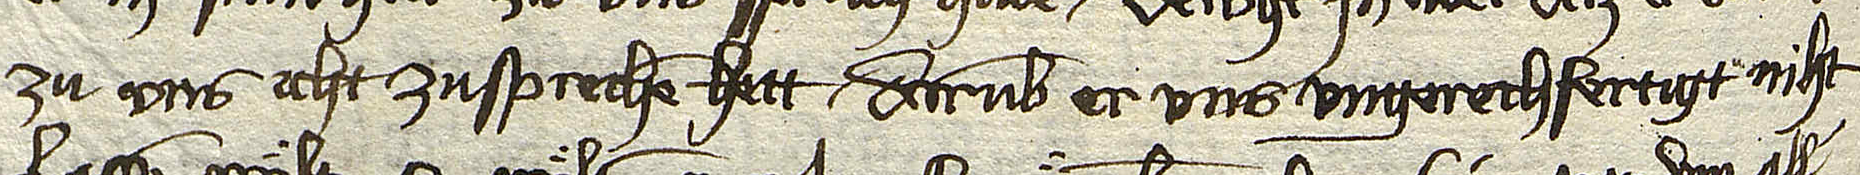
ʒu vns icht ʒuſpreche* hett / darub* er vns vngerechfertigt niht
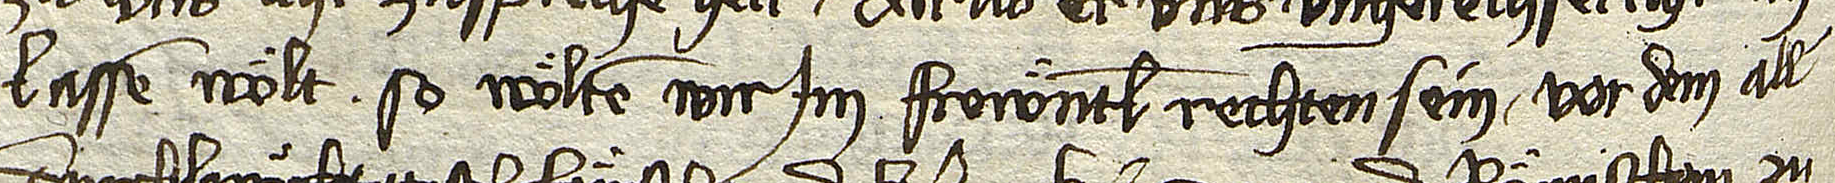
laſſe* wölt . ſo wölte* wir Im frewntl* rechten ſein / vor dem all*
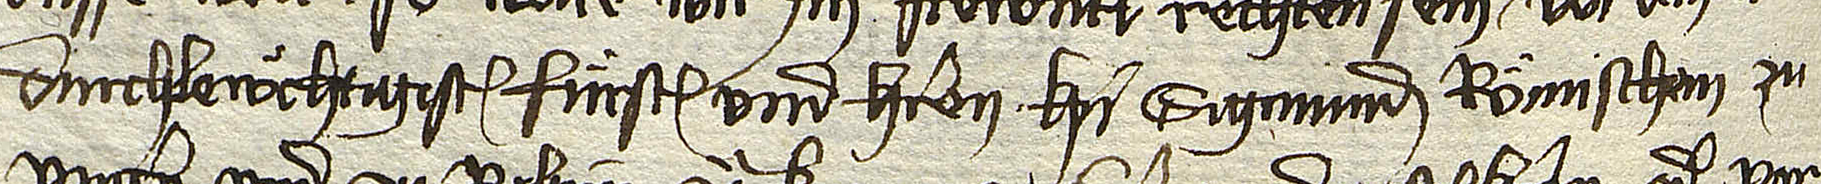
durchlewchtigiſt* fürſt* vnd h*ren . Hr* Sigmund* Römiſchen ʒu
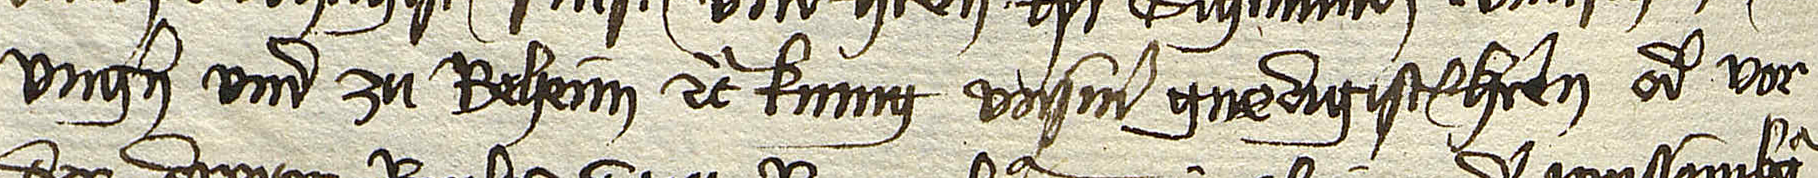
Vng*n vnd ʒu Beheim ec* kunig vnſ*m gnedigiſt* h*ren od* vor
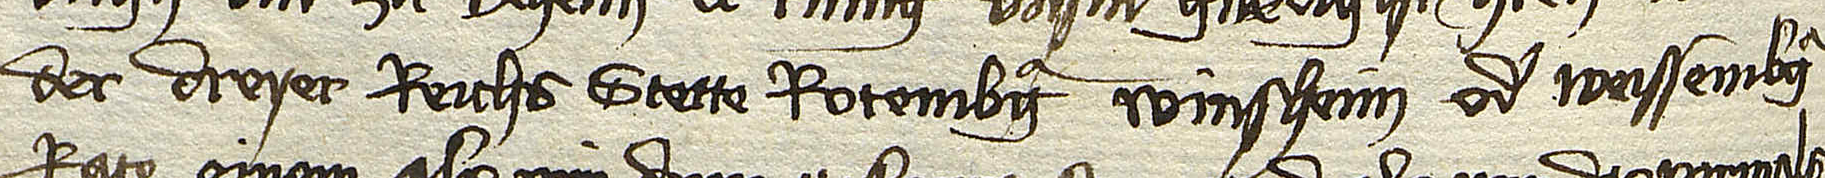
der dreyer Reichs Stette Rotembg* winſheim od* weiſſembg*
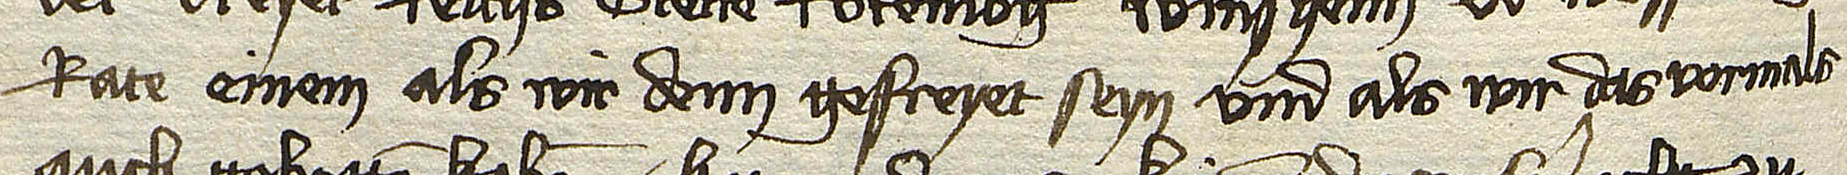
Rate einem als wir denn gefreyet ſeyn vnd als wir das vormals
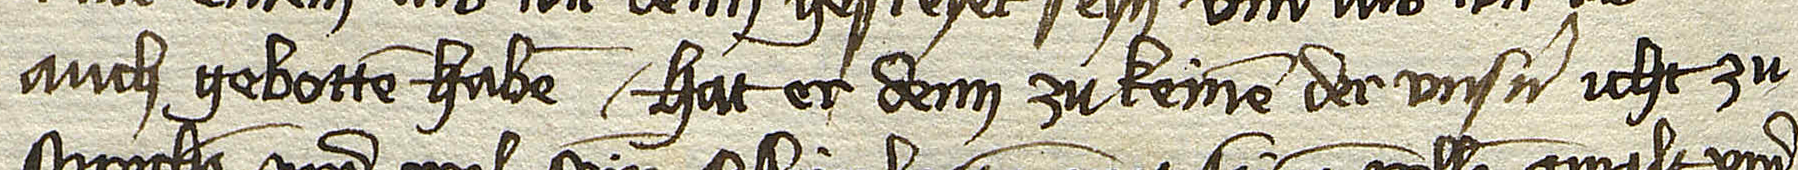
auch gebotte* habe* / hat er denn ʒu keine* der vnſ*n icht ʒu
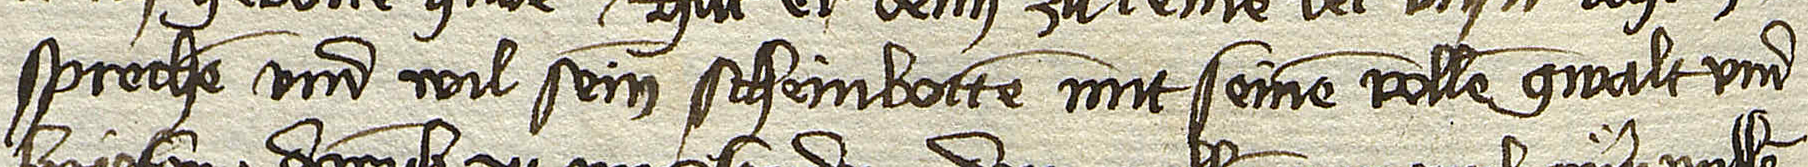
ſpreche* vnd wil ſein* ſcheinbotte* mit ſeine* volle* gwalt vnd
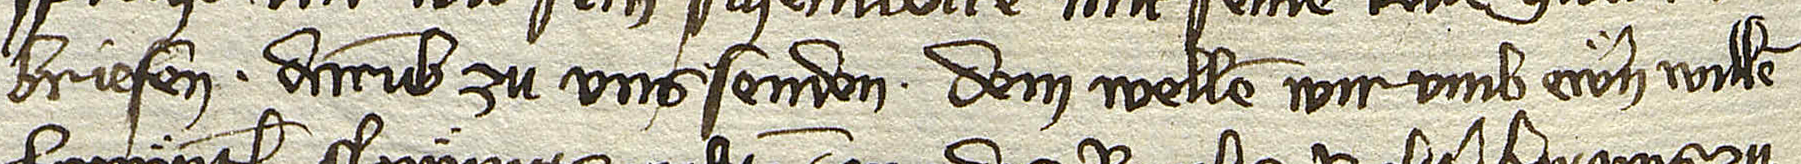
briefen . darub* ʒu vns ſenden . dem welle* wir vmb ew*n wille*
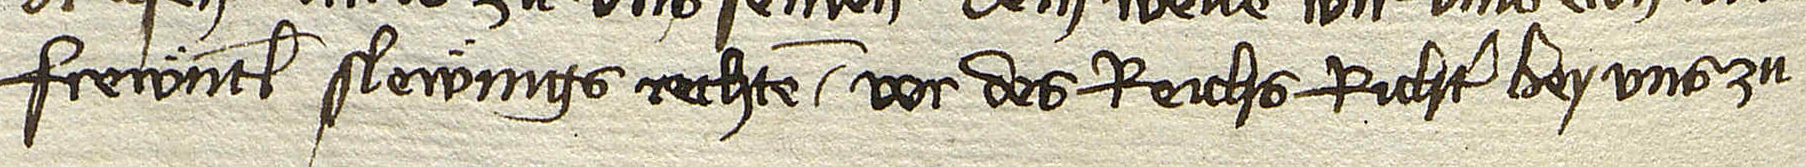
frewntl* ſlewnigs rechte* / vor des Reichs Richt* bey vns ʒu
